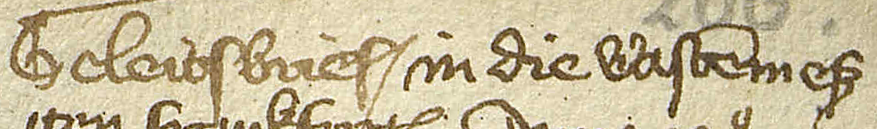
Geleitſbrief / in die vaſte*meſʒ
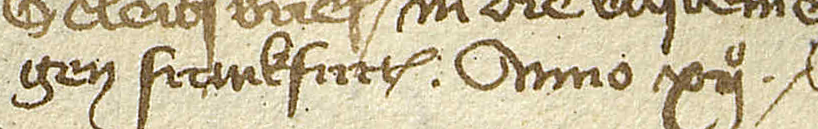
gen frankfurt / . Anno xii* . /
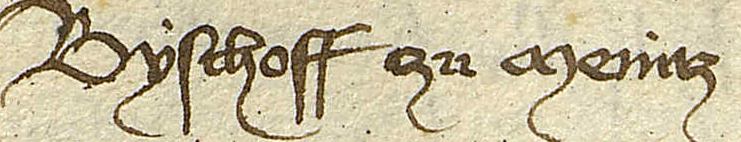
Byſchoff cʒu Meincʒ
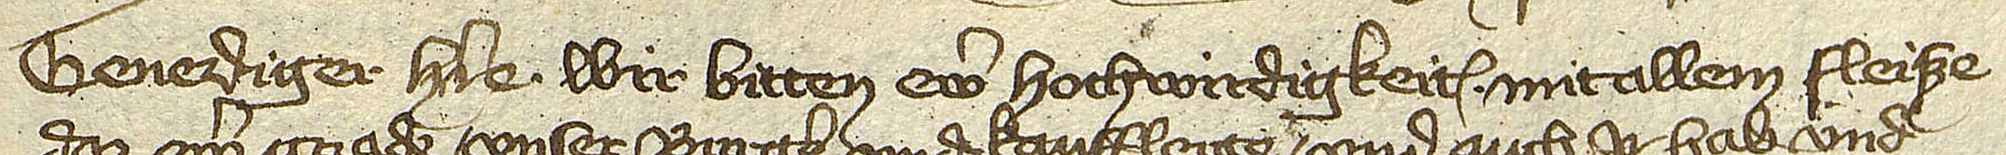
Gnediger h*re . wir bitten ew* hochwirdigkeit* . mit allem fleiſʒe
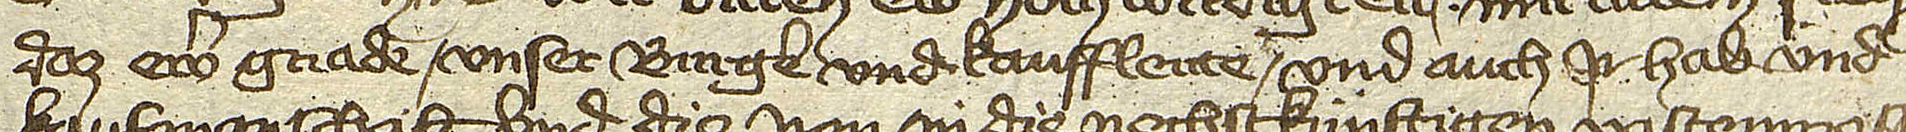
daʒ ew* gnade / vnſer Burge* vnd kauffleute / vnd auch Ir hab vnd
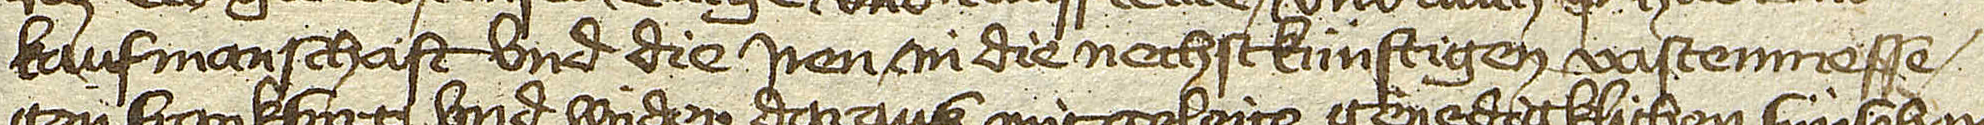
kaufmanſchaft vnd die Iren in die nechſt künftigen vaſtenmeſſe /
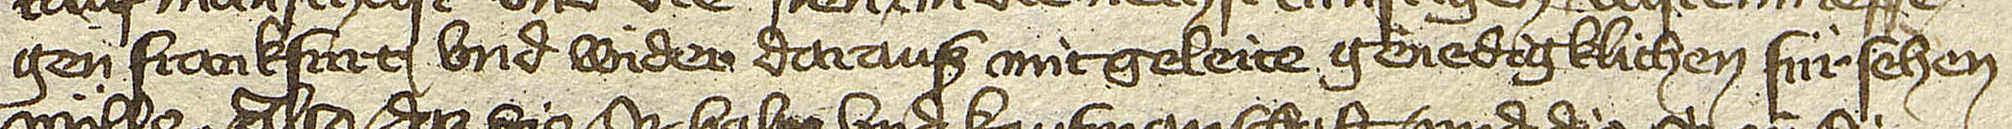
gen frankfurt vnd wider darauſʒ mit geleite genedigklichen fürſehen
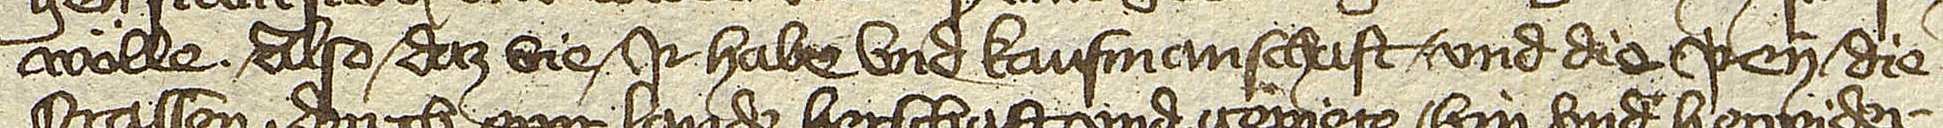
wölle . / Alſo / daʒ die / Ir habe vnd kaufmanſchaft / vnd die Iren / die
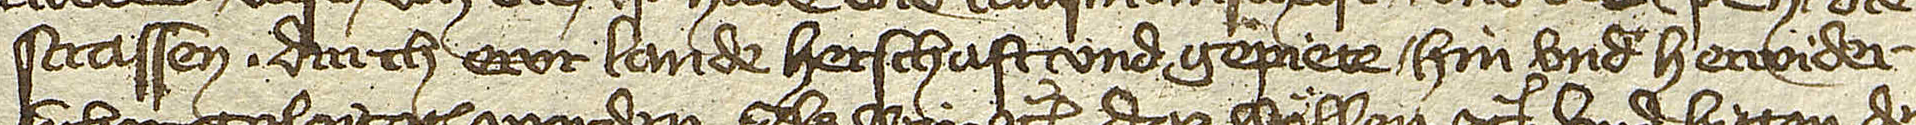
ſtraſſen . durch ewr lande herſchaft vnd gepiete / hin vnd herwider
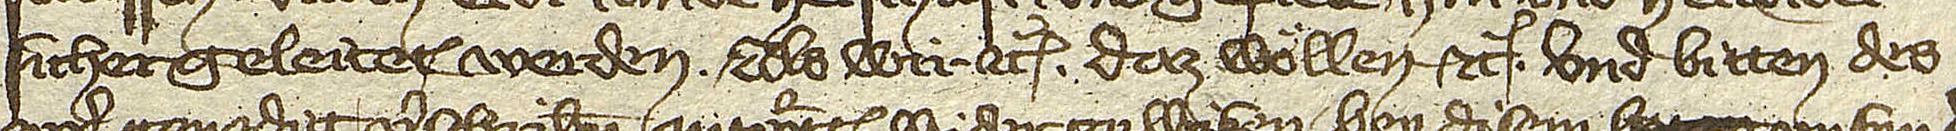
ſicher geleitet werden . / Als wir ec* . daʒ wöllen ec* . vnd bitten des
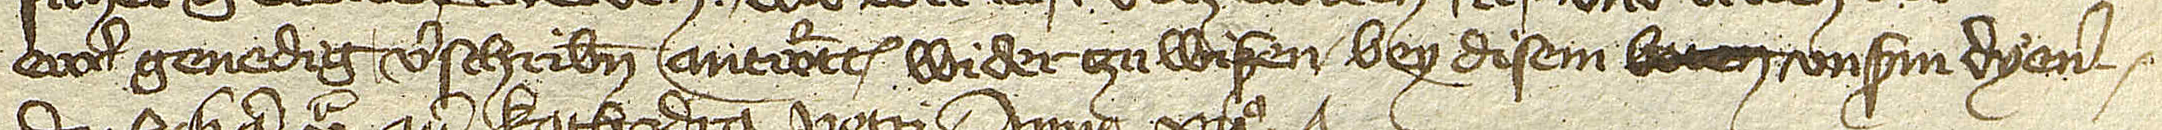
ew* genedig v*ſchribn* antwt* wider cʒu wiſʒen / bey diſem boten vnſ*m dyen* - /
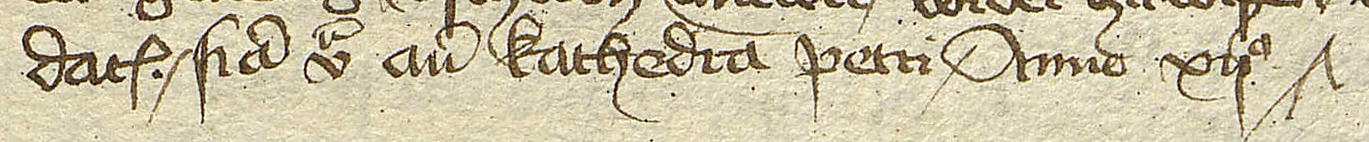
dat* . / fia* v* an* kathedra petri / Anno xii* /
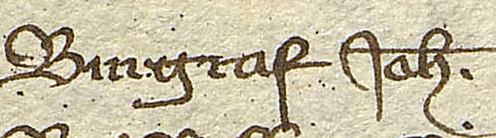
Burgraf Ioh*.
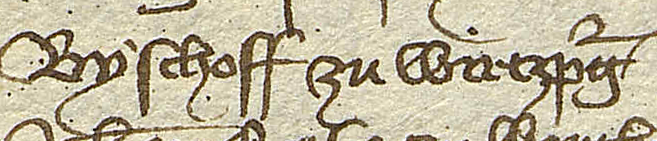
Byſchoff cʒu wircʒp*g /
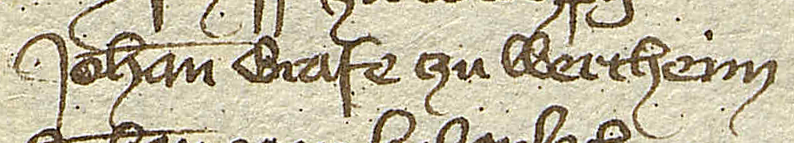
Iohan* Grafe cʒu wertheim
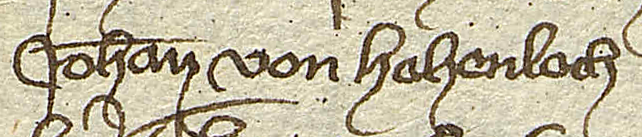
Iohan* von hohenloch
